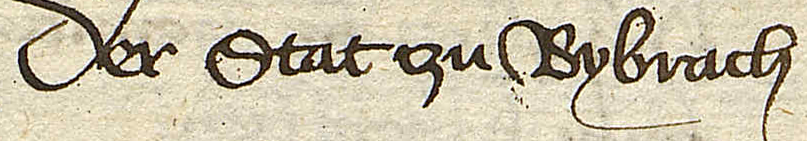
Der Stat cʒu Bybrach
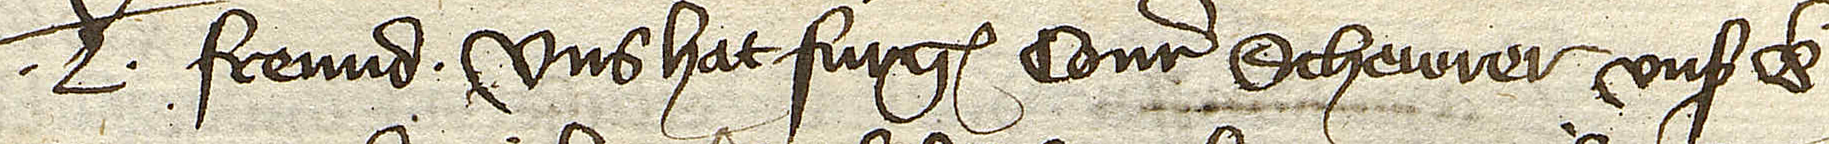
. L* . freund . Vns hat fürg* Conr* Schewrer vnſ* B*
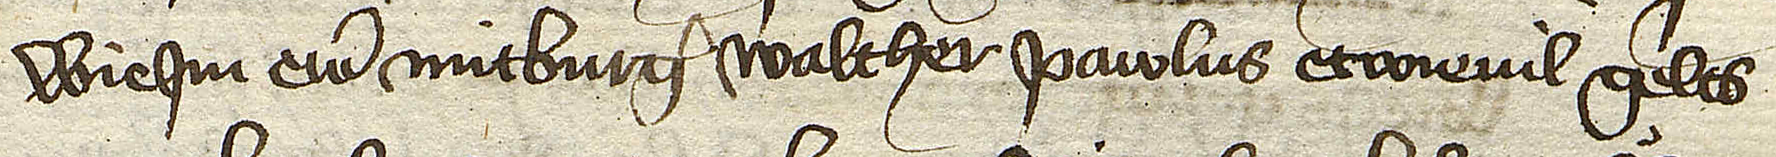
wie Im ew* mitburg* walther pawlus etwieuil gelts
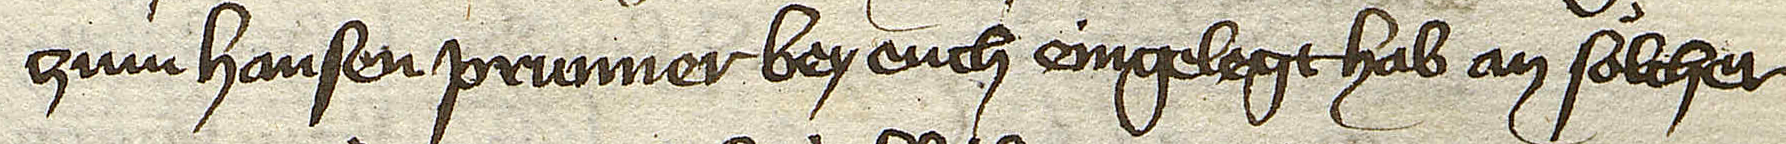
cʒum hanſen prunner bey euch eingelegt hab an ſölcher
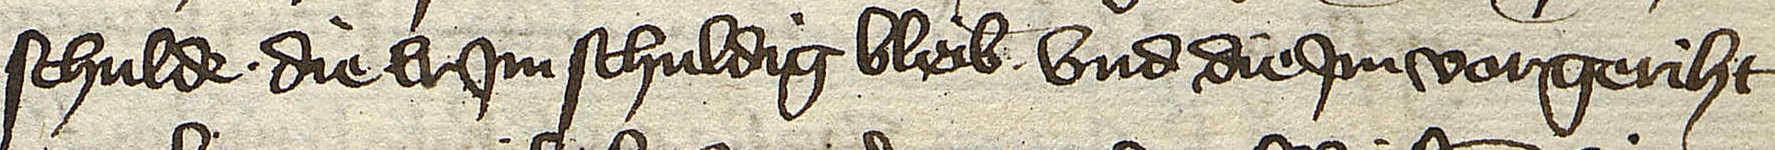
ſchulde . die Er Im ſchuldig bleib . vnd die Im vorgeriht
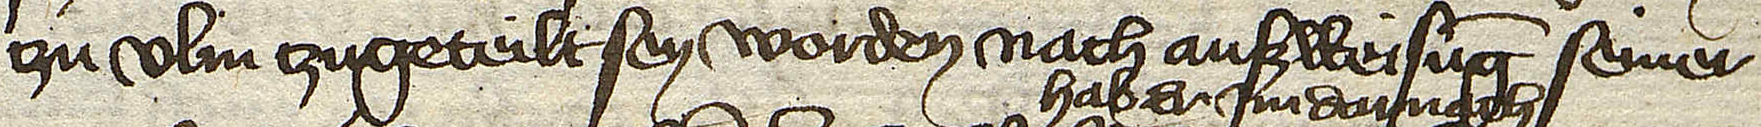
cʒu vlm cʒugeteilt ſey worden nach auſʒweiſu*g ſeiner
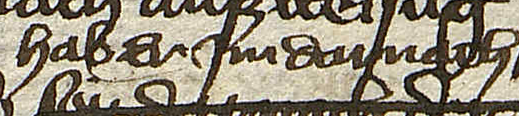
hab Er Im darnach
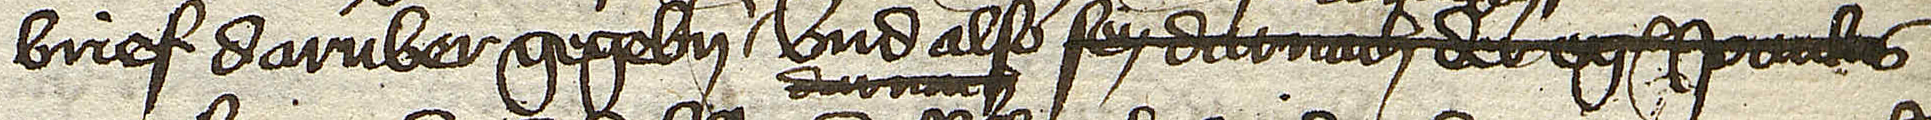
brief darüber gegebn* / Vnd alſo ſey darnach der eg* paulus
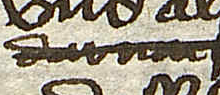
darnach
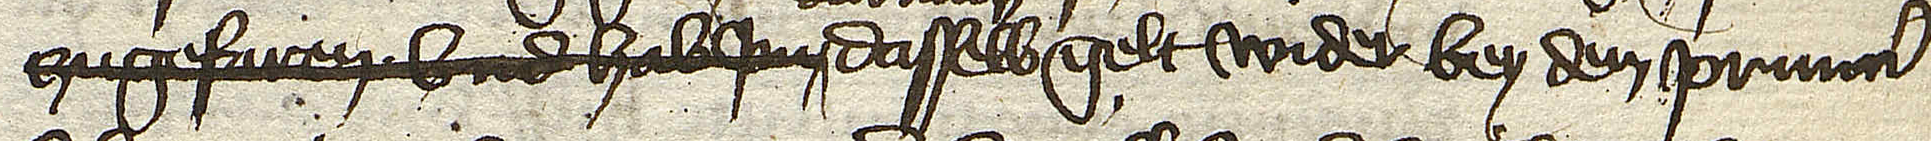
cʒugefaren . vnd hab Im daſſelb gelt wider bey dem prunn*
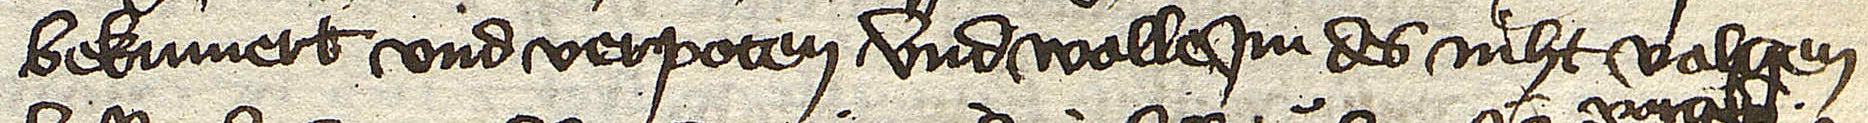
bekumert vnd verpoten / vnd wölle Im des niht volgen
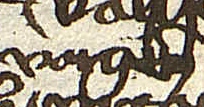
vorgen*
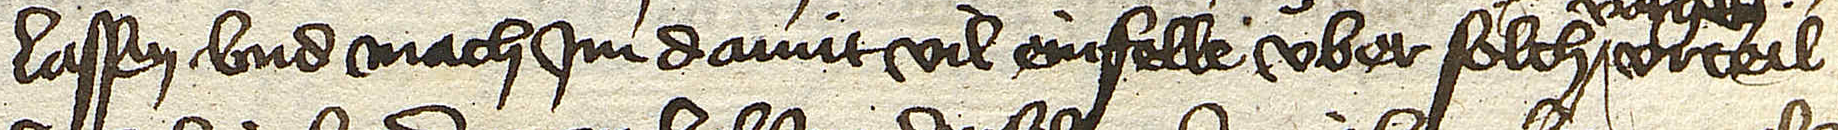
laſſen / vnd mach Im damit vil einfelle v̈ber ſölch vrteil
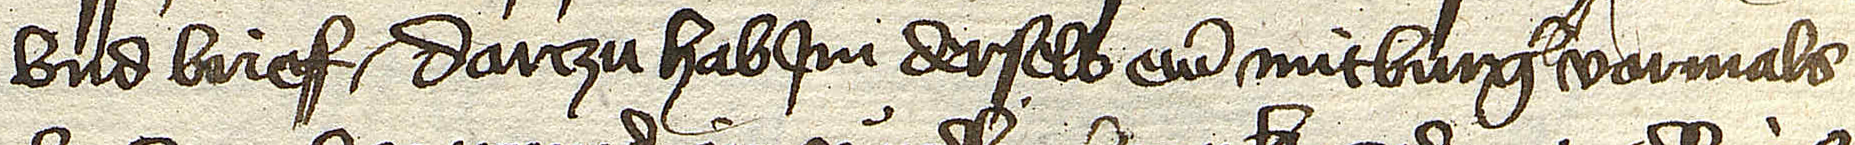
vnd brief / Darcʒu hab Im derſelb ew* mitburg* vormals
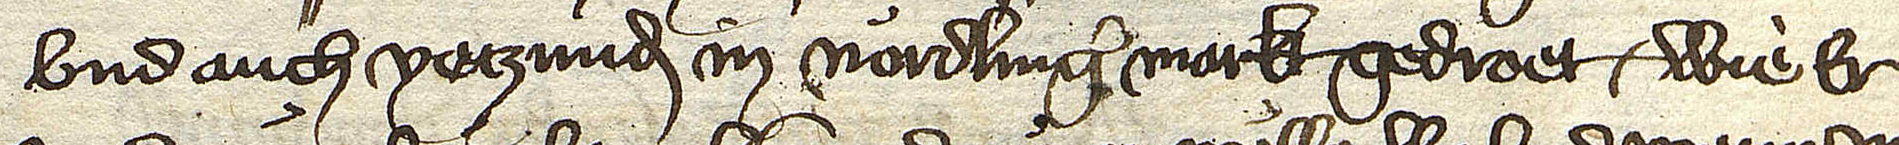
vnd auch yecʒund* in nördling* markt gedroet / wie Er
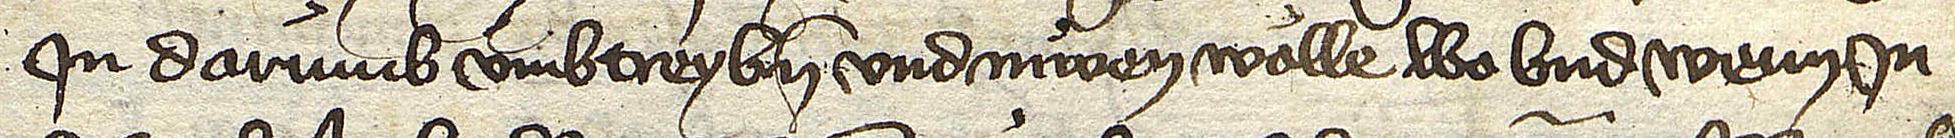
In darümb v̈mbtreybn* vnd mẅen wölle wo vnd wenn In
